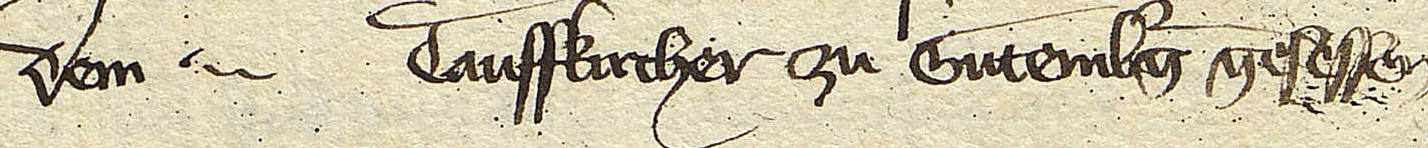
Dem ~ Tauffkircher cʒu Gutemb*g geſeſſen
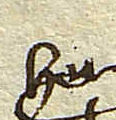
her
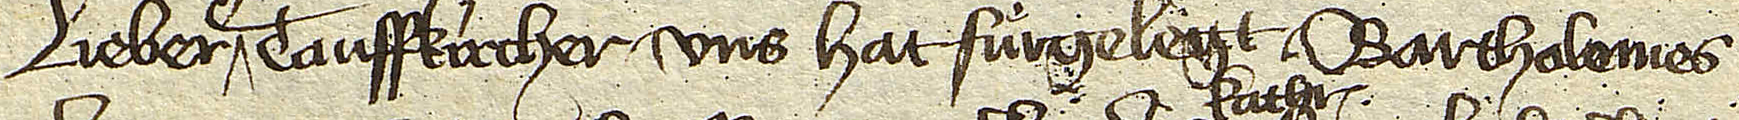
Lieber Tauffkircher / vns hat fürgelegt / Bartholemes
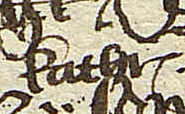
Kathr*
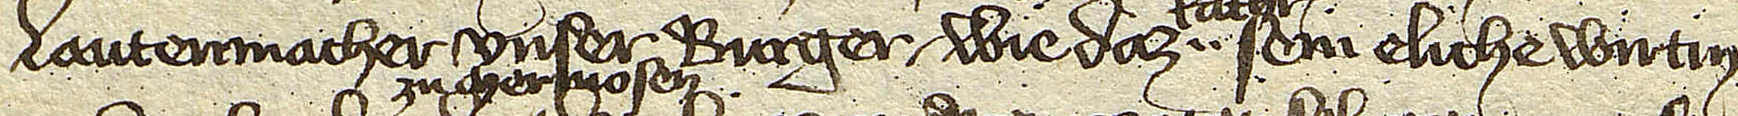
lautenmacher vnſer Burger / wie daʒ ~ ſein eliche wirtin
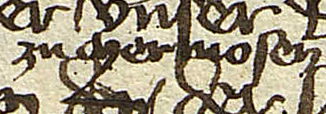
ʒu Mer%oſen
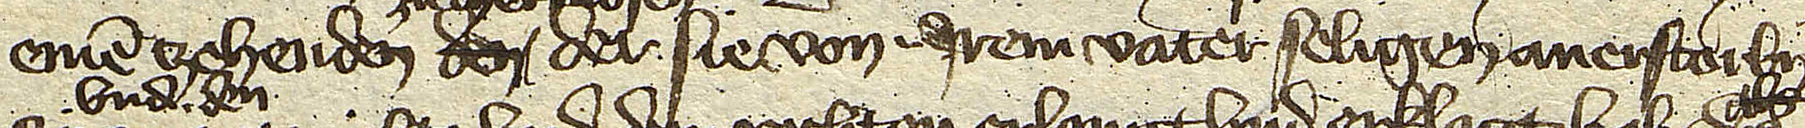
eine* cʒehenden den der ſie von ~ Irem vater ſeligen anerſtorbn*
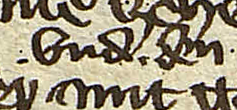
vnd den
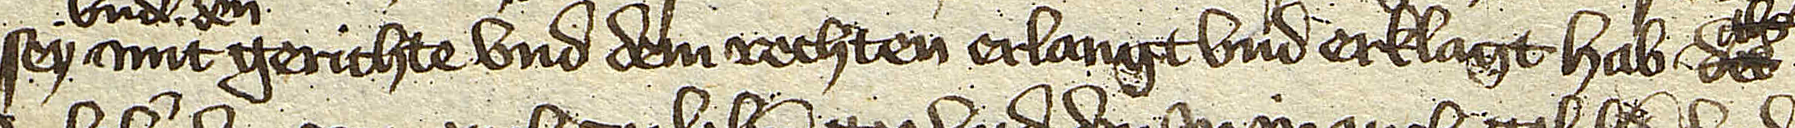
ſey mit gerichte vnd dem rechten erlangt vnd erklagt hab / des
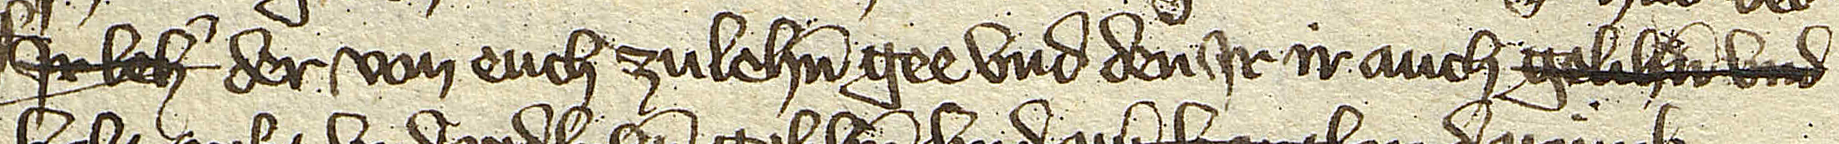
Ir leh* der von euch ʒulehn* gee vnd den Ir ir auch gelihn* vnd
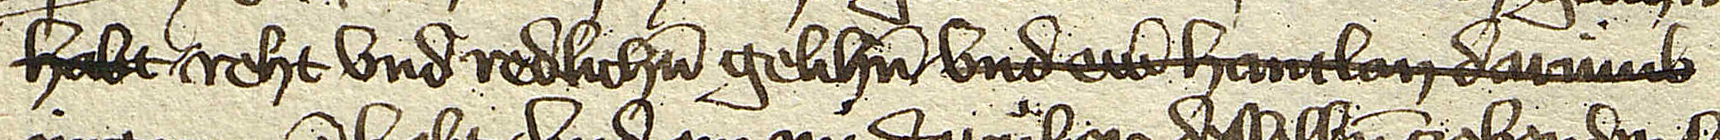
habt / reht vnd redlichn* gelihn* / vnd ew* hantlan darümb
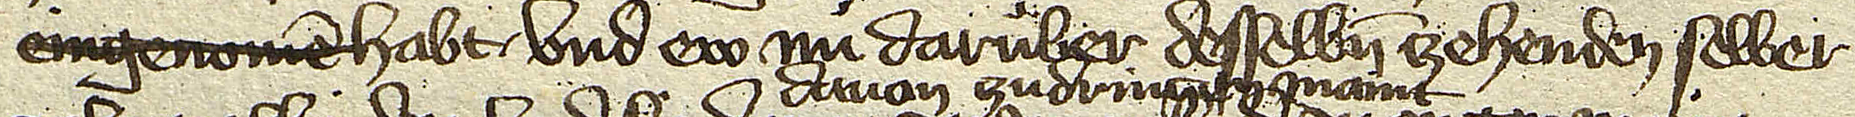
eingenome* habt / vnd ew nü darüber deſſelbn* cʒehenden ſelber
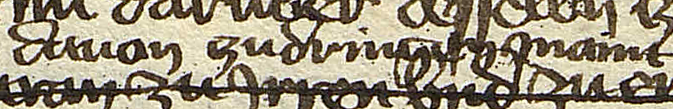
dauon cʒudringen maint
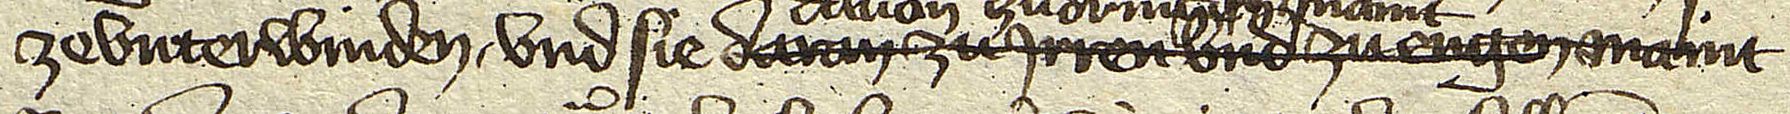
cʒevnterwinden / vnd ſie daran cʒu Irren vnd cʒu engen maint
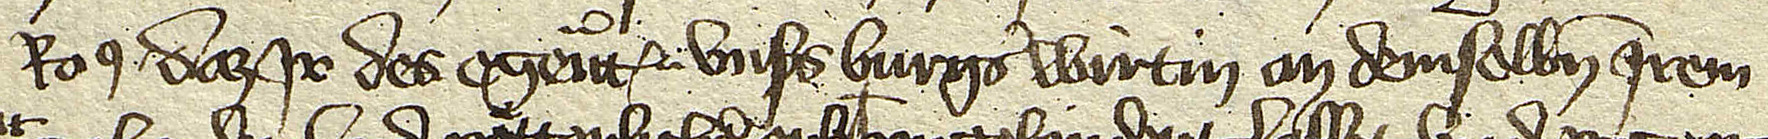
Ro* / daʒ Ir des egent* ~ vnſ*s burgs* wirtin an demſelbn* Irem
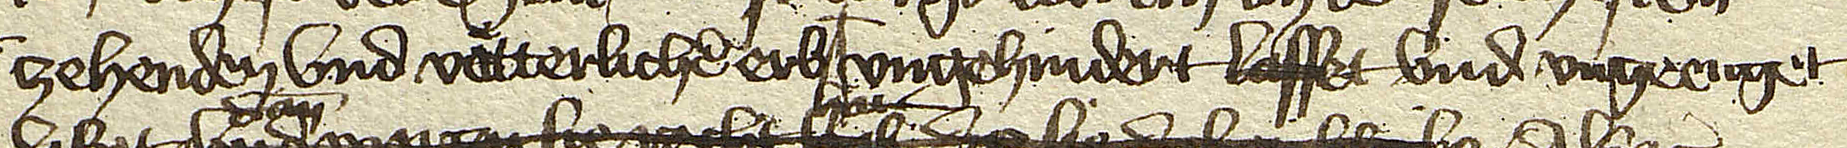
cʒehenden vnd vätterliche* erb vngehindert laſſet vnd vngeenget
